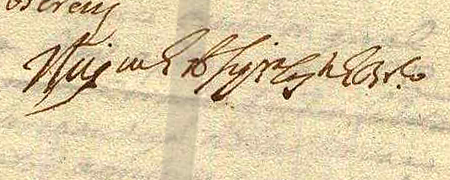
Miguel d̄ siq.ra Castel Br.co
